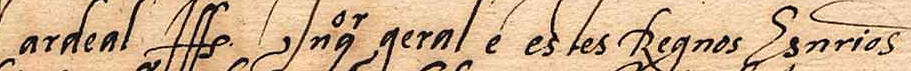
Cardeal Jffꝭ Jnqor geral ē estes Regnos E sn̄rios
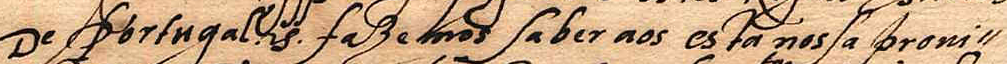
De Portugal cꝭ. fazemos saber aos esta nossa proui
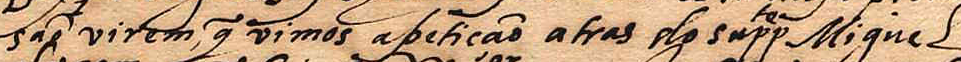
são virem, q̄ vimos a petição atras do suppte Miguel
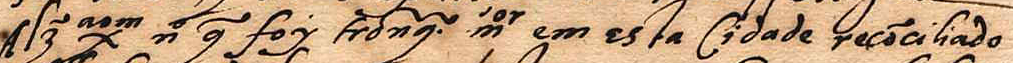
Alz̄ xaom no q̄ foy tronq.ro mor em Esta Cidade recōciliado
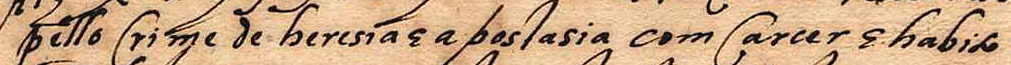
pello Crime de heresia E apostasia com Carcer E habito
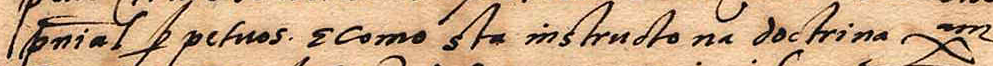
p̄nial ꝑpetuos E como sta instructo na doctrina Xam
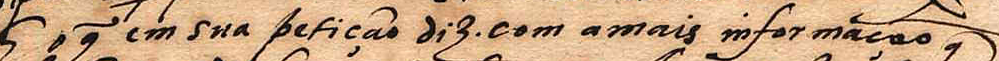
E o q̄ em sua petição diz com a mais informação q̄
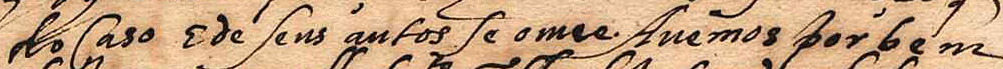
do Caso E de seus autos se ouue. Auemos por bem
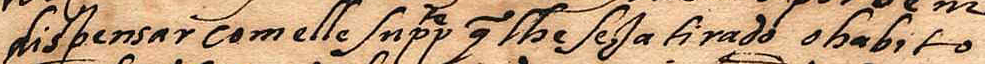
dispensar com elle suppte q̄ lhe seJa tirado o habito
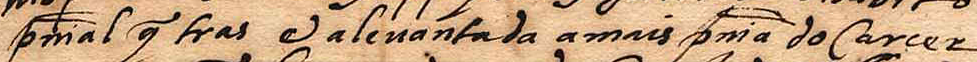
p̄nial q̄ tras e aleuantada a mais pn̄ia do Carcer
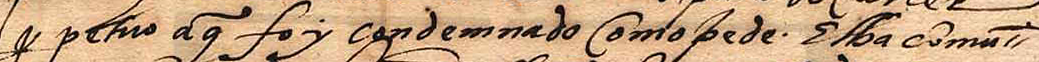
ꝑpetuo a q̄ foy condemnado Como pede. E lha cōmū
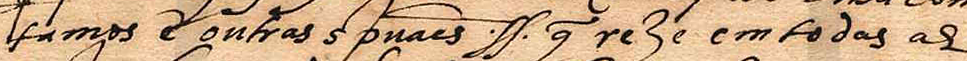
tamos ē outras sp̄uaes .ss. q̄ reze em todas as
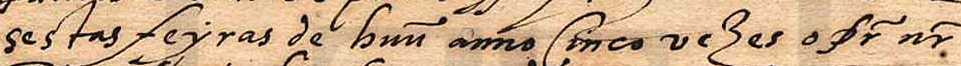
sestas feyras de huū anno Cinco vezes o pr̄ nr̄.
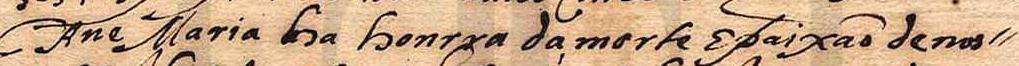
E Aue Maria ha honrra da morte E paixão de nos
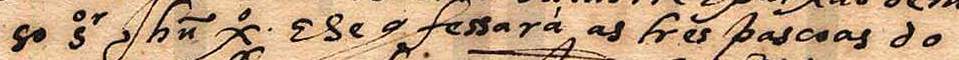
so sor Jhū xo. E se ꝯfessará as tres pascoas do
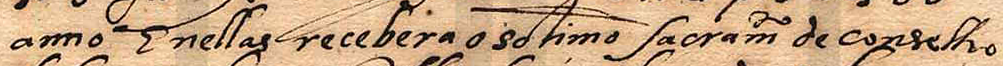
anno E nellas recebera o s̄ctimo sacramto de conselho
